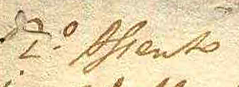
2.o Assento
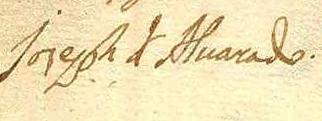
Jozeph d̄ Aluarado.
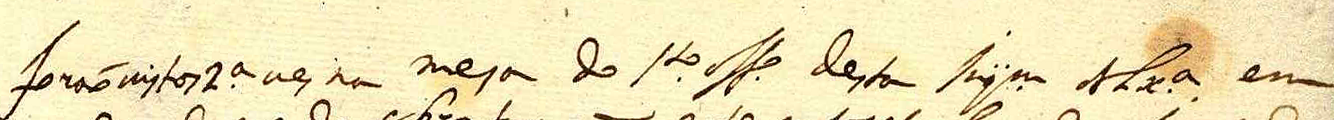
foraõ uistos 2.a ues na mesa do s.to off.o desta Inq.m d̄ Lx.a em
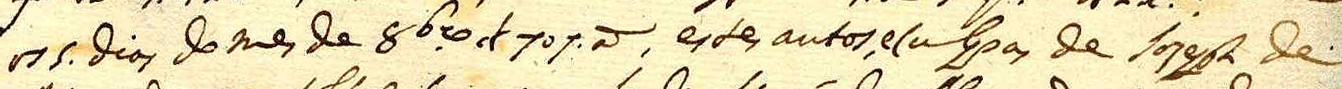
os 5. dias do mes de 8b.ro d̄ 707. ā. estes autos, e culpas de Iozeph de
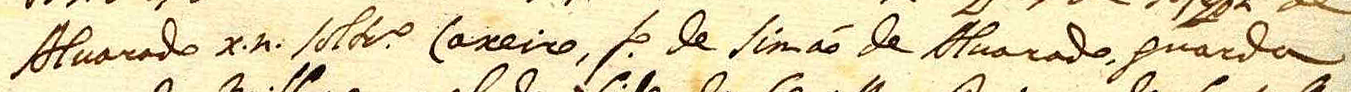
Aluarado x. n. soltr.o Caxeiro, f.o de Simaõ de Aluarado, guarda
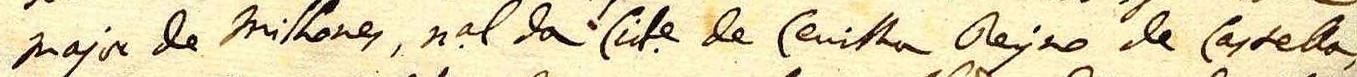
major de milhones, n.al da Cid.e de Ceuilha Reyno de Castella,
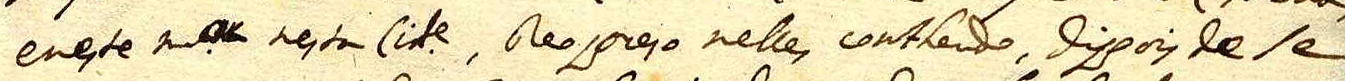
e neste m.or nesta Cid̄e, Reo prezo nelle, contheudo, dispois de se
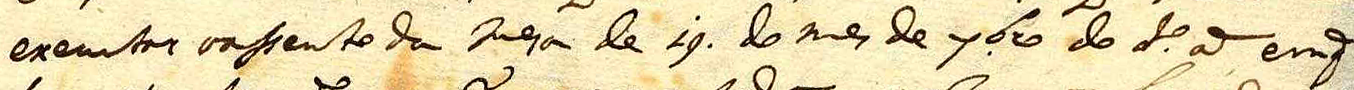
executar o assento da mesa de i9. do mes de 7.bro do d̄.o ā, em q̄
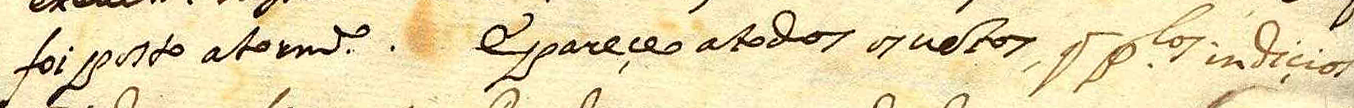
foi posto a torm.to. E pareceo a todos os uotos, q̄ p.los indicios
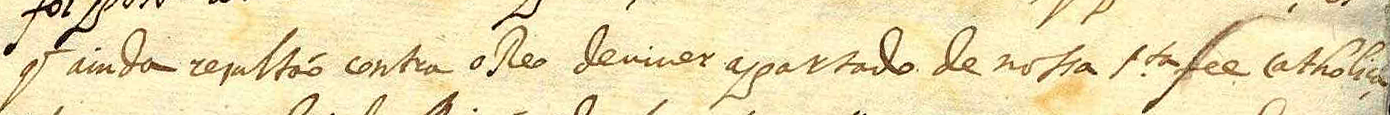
q̄ ainda resultaõ contra o Reo de uiuer apartado de nossa s.ta fee catholica
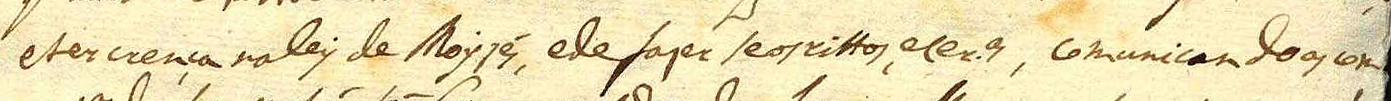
e ter crença na ley de Moyzés, e de fazer seos rittos e cer.as, comunicandoas com
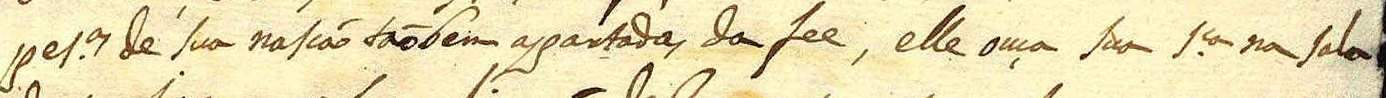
pes.as de sua nasçaõ taõbem apartadas da fee, elle ouça sua s.ça na sala
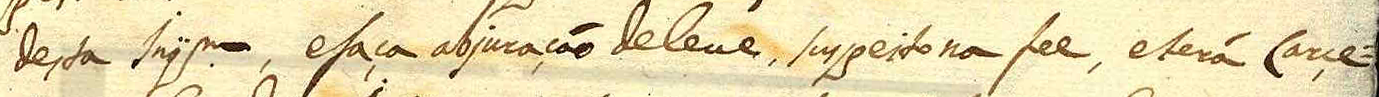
desta Inq.m, e faça abjuraçaõ de leue, suspeito na fee, e terá Carce
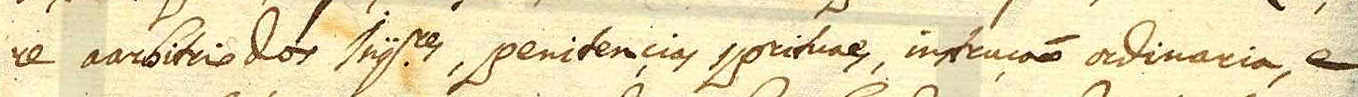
re a arbitrio dos Inq.res, penitencias sprituaes, instruçaõ ordinaria, e
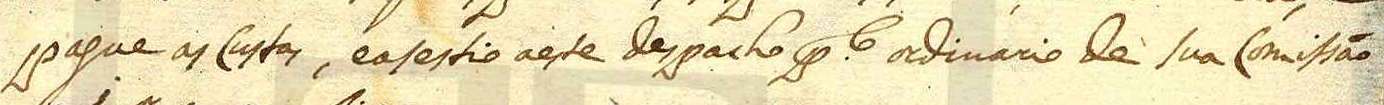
pague as Custas, e asestio a este despacho p.lo ordinario de sua Comissão
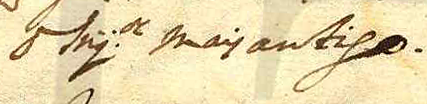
o Inq.or mais antigo.
